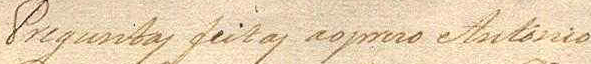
Preguntas feitas ao prezo António
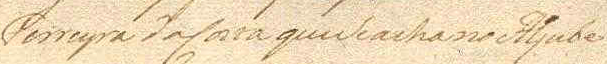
Ferreyra da Costa que se acha no Aljube
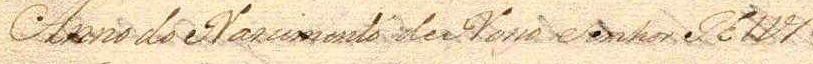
Anno do Nascimento de Nosso senhor IESVS
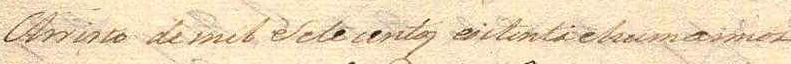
Christo de mil setecentos oitenta e hum annos
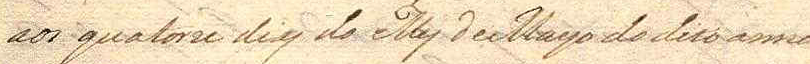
aos quatorze dias do Mes de Mayo do dito anno
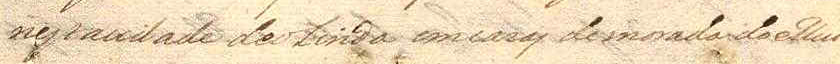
nesta cidade de olinda em cazas de morada do Mui
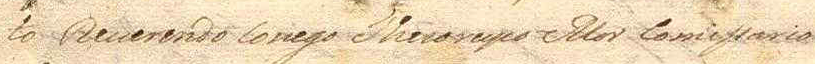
to Reverendo Conego Thezoreyro Mor Comissario
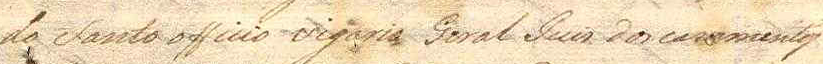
do Santo officio vigario Geral Iuis dos casamentos
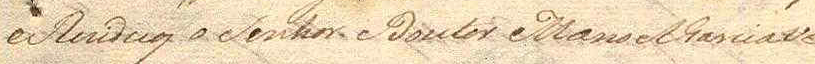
e Reziduos o Senhor Doutor Manoel Garcia Ve
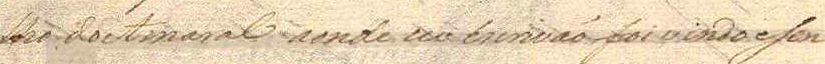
lho do Amaral aonde no Escrivão foi indo e sen
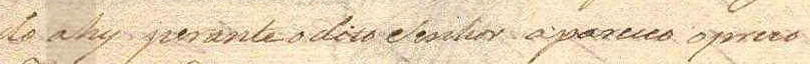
do ahy perante o dito senhor apareceo o prezo
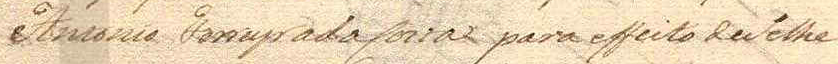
Antonio Ferreyra da Costa para effeito de se lhe
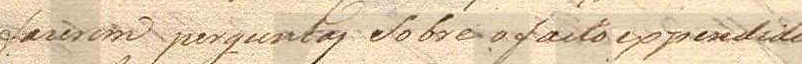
fazerem perguntas sobre o facto expendido
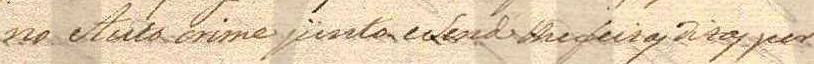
no Auto crime junto e sendo lhe feitas ditas per
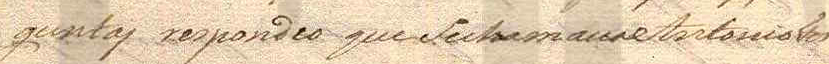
guntas respondeo que se chamava Antonio Fer
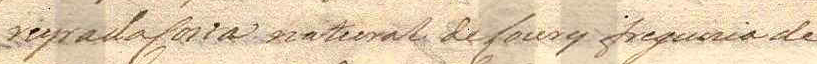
reyra da Costa natural de Loures freguezia de
